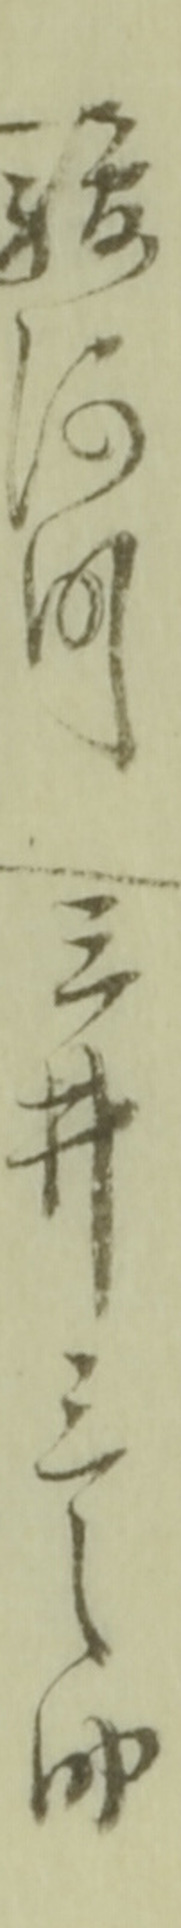駿河町三井三之助
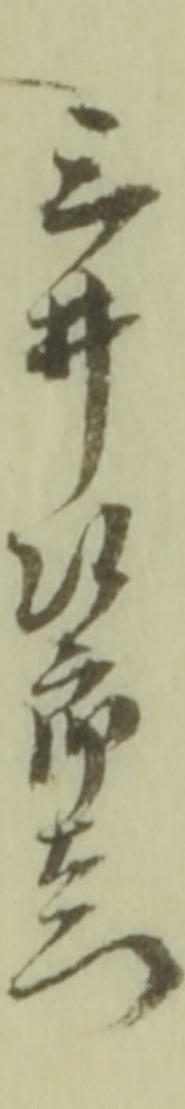三井次郎右衛門
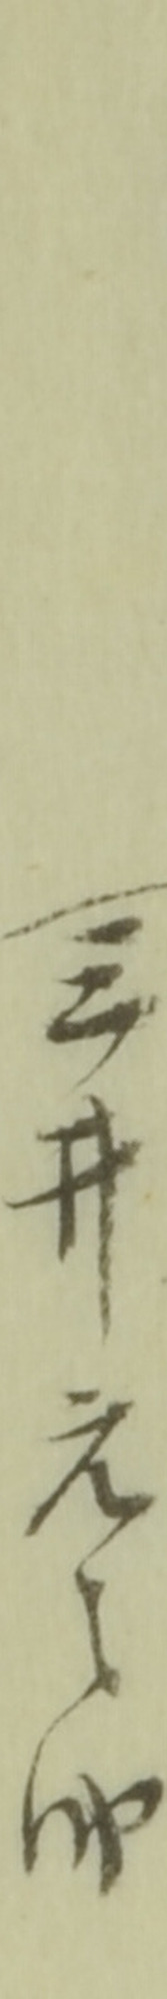三井元之介
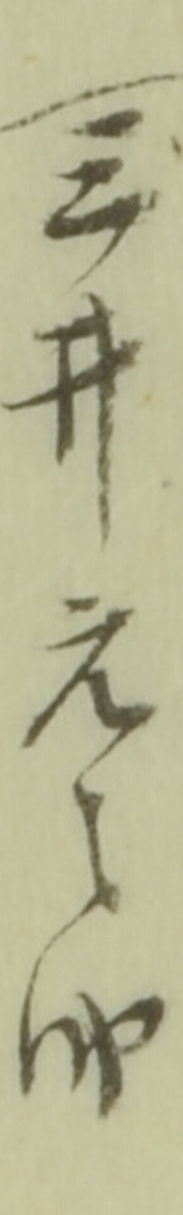三井元之介
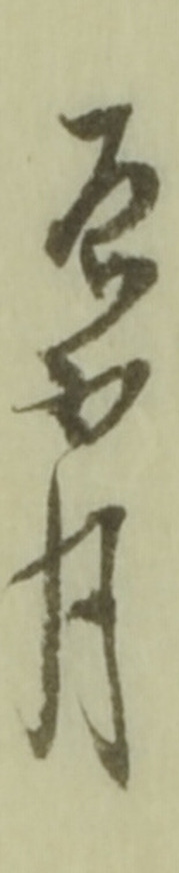辰五月
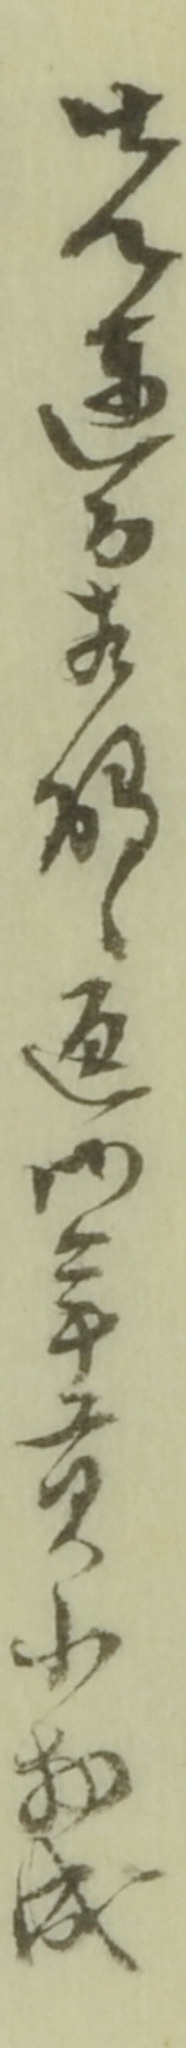先達而相触候通御年貢小物成
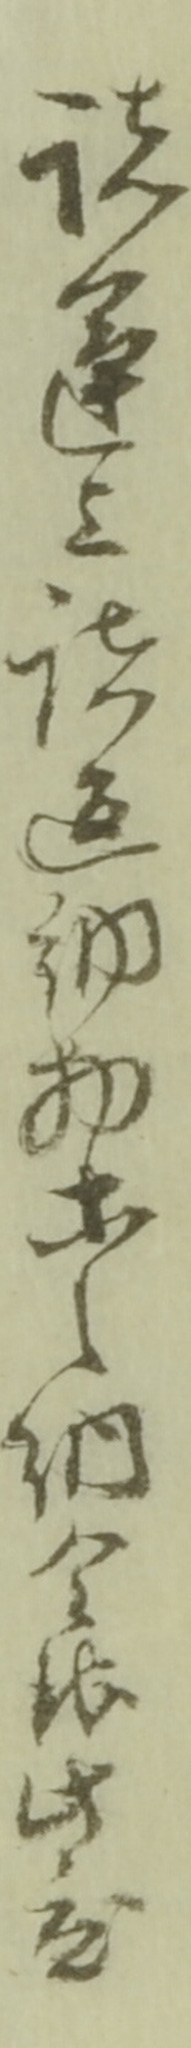諸運上諸返納調物等候納金銀此度
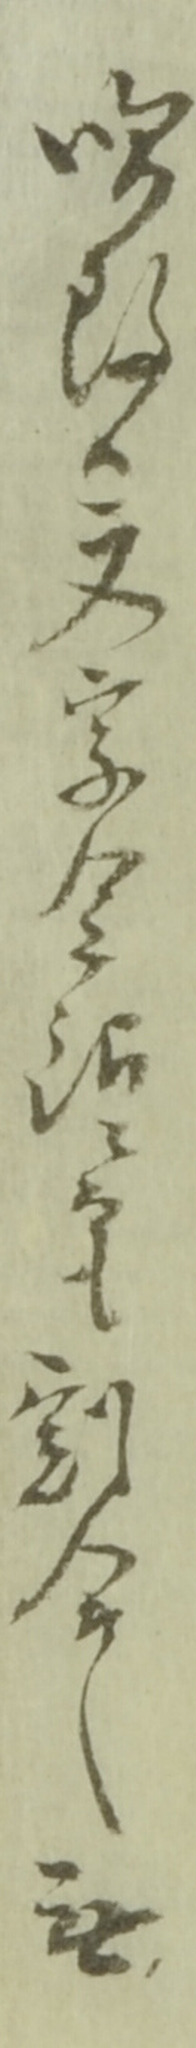吹改候文字金銀二而も割合之無

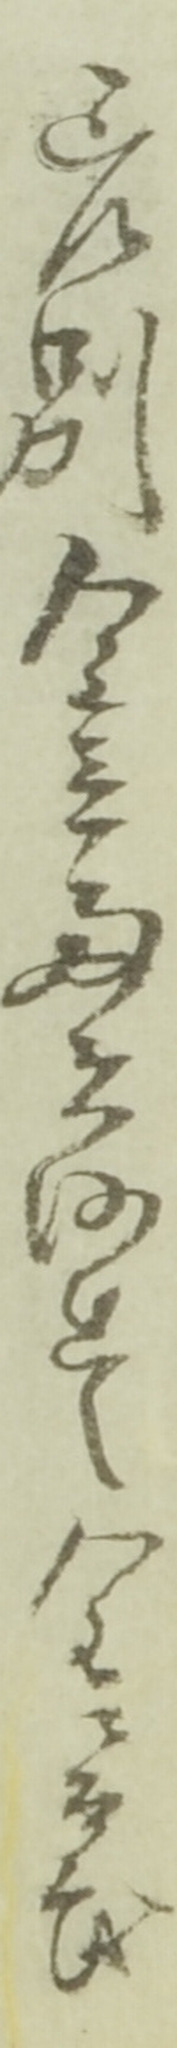差別金壱両者何連之金二而茂
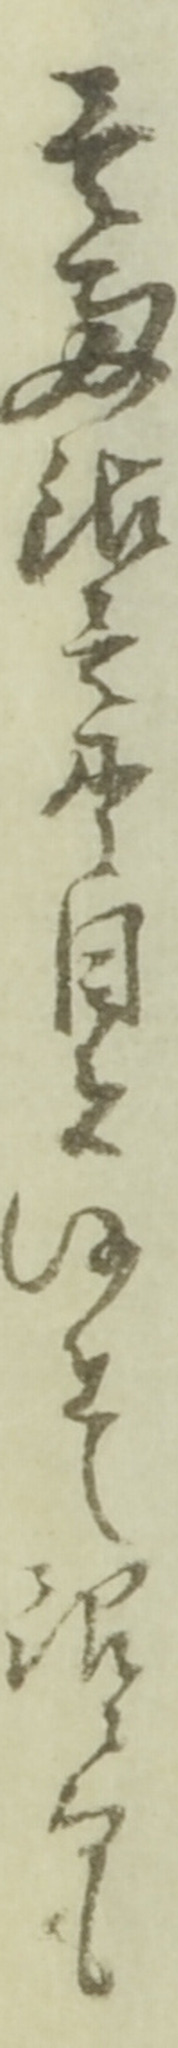壱両銀壱貫目者何連之銀二而も
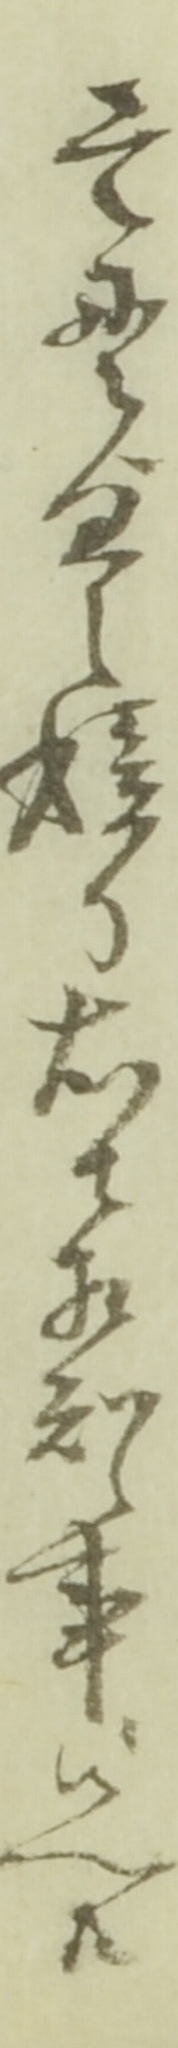壱貫余之積り右之相知候事二候へ共
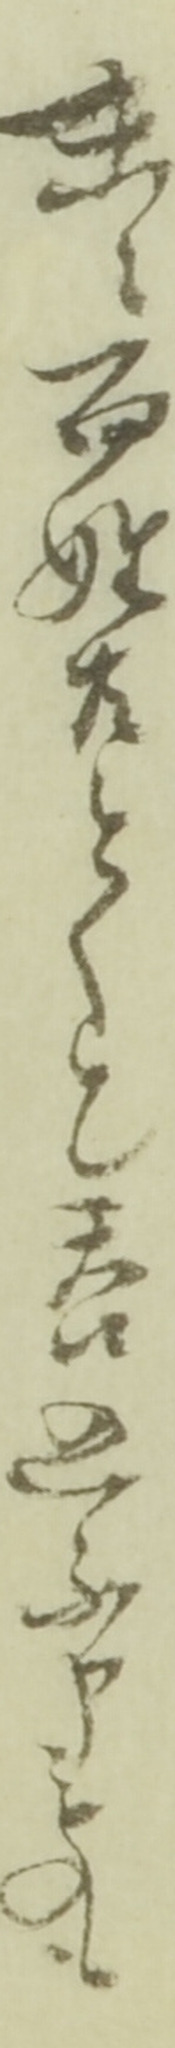末々百姓共とくと吞込不申ものも
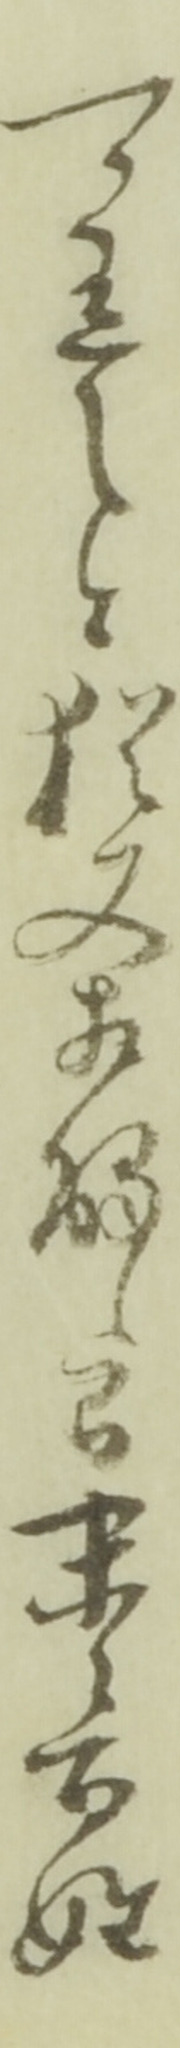可有之候猶又相触候間末々百姓
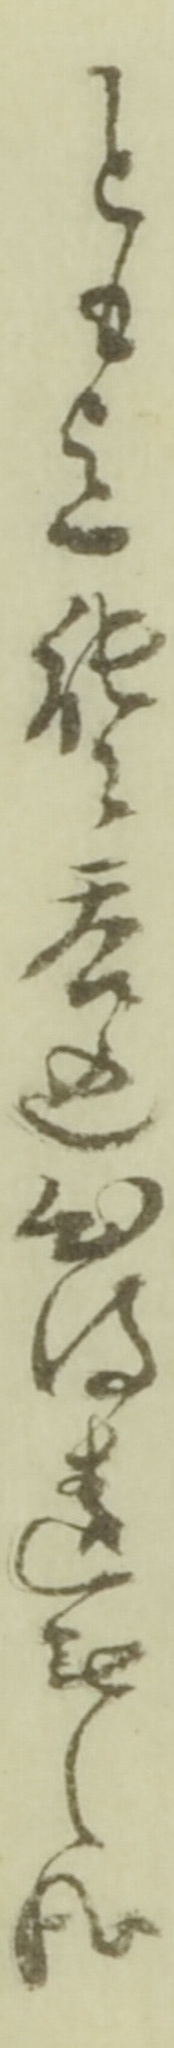とも能ゝ呑込心得違無候儀
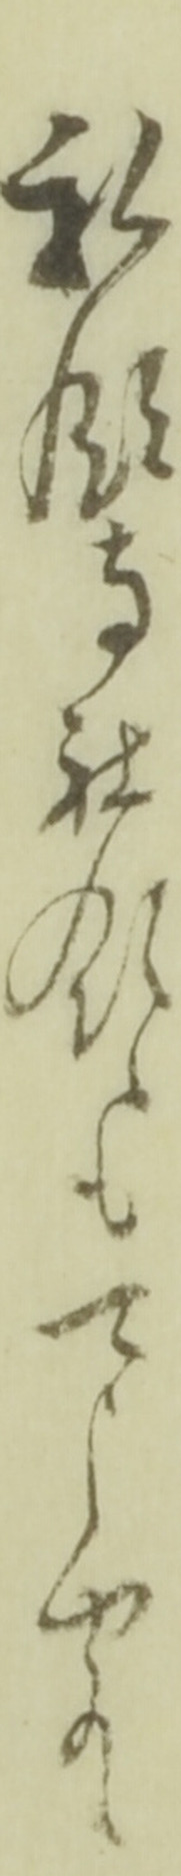私領寺社領二も可申聞候
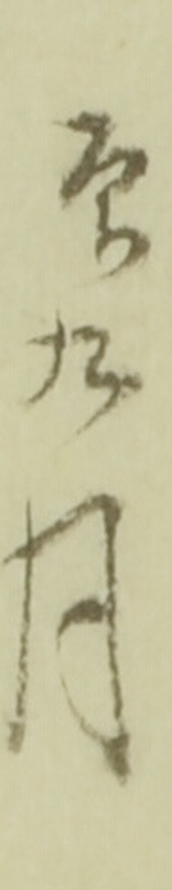辰九月
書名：御公儀様御領主様御触書控
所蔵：伊那市立高遠町図書館・合同会社AMANE
